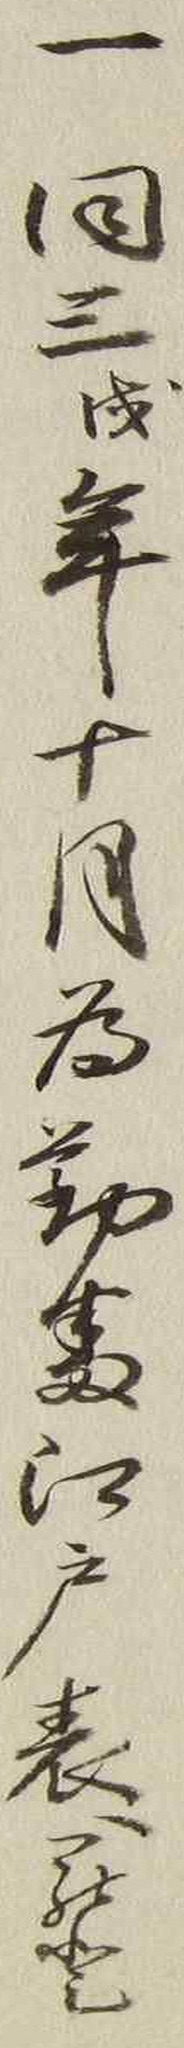一同三戌年十月為勤番江戸表へ罷登
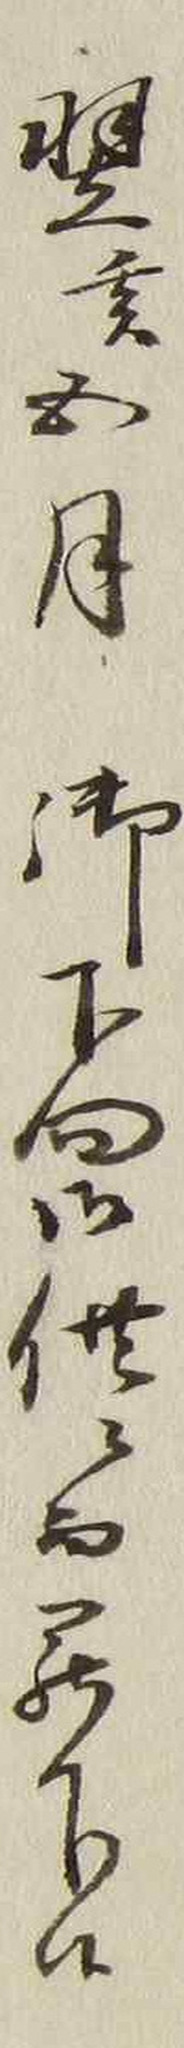翌亥五月御下向御供ニ而罷下候
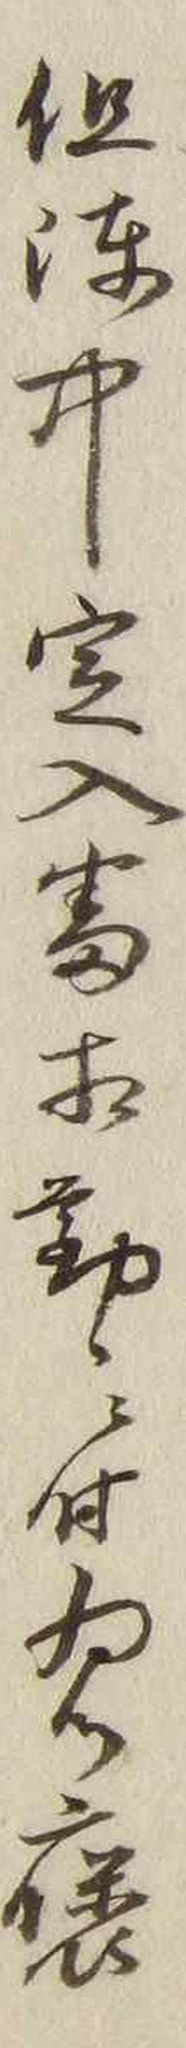但陣中定入番相勤候ニ付為御褒

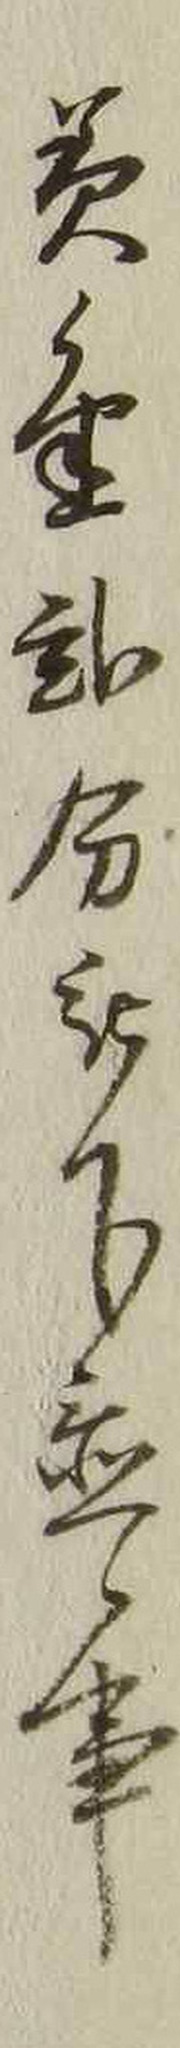美金弐分被下置候事
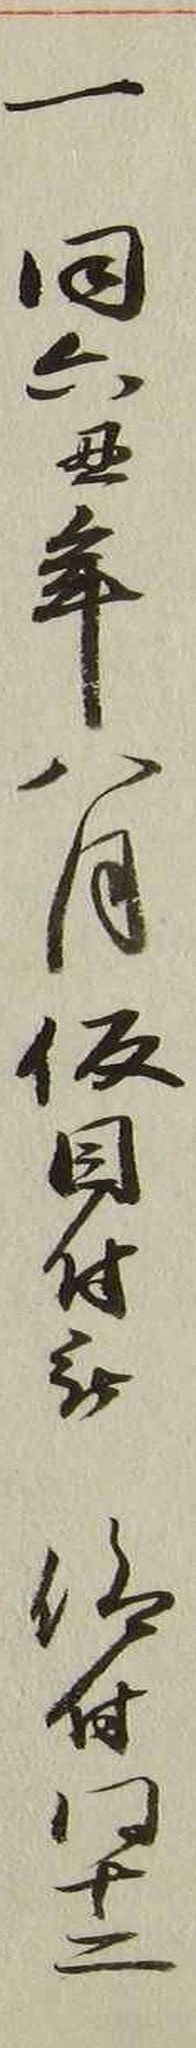一同六丑年八月仮目付被仰付同十二
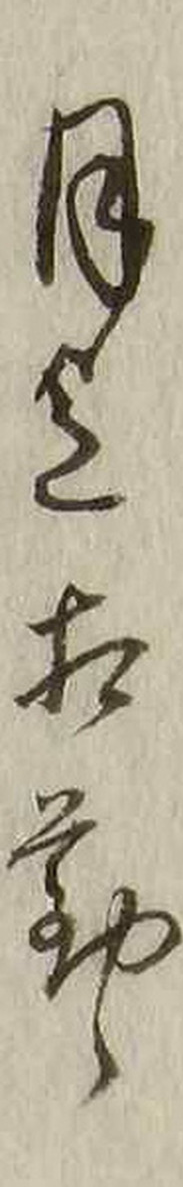月迄相勤候
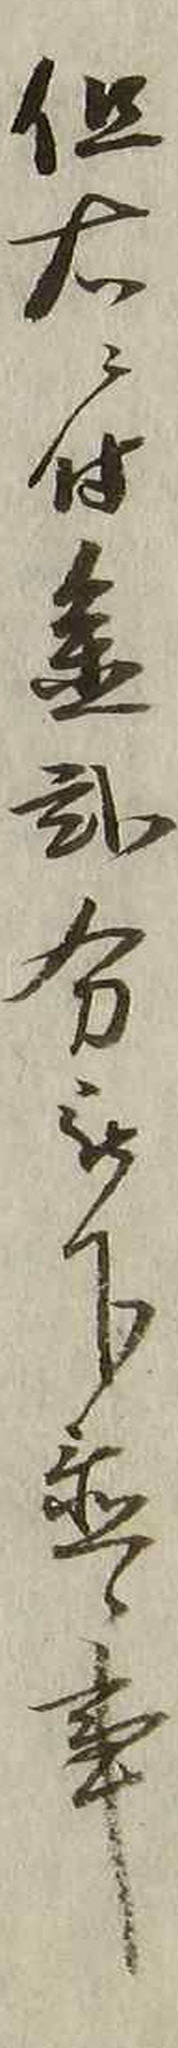但右ニ付金弐分被下置候事
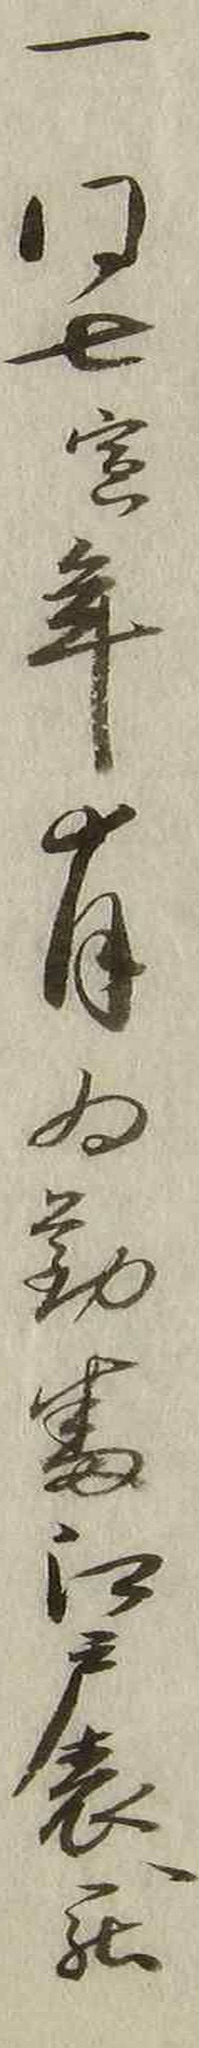一同七寅年十月為勤番江戸表へ罷
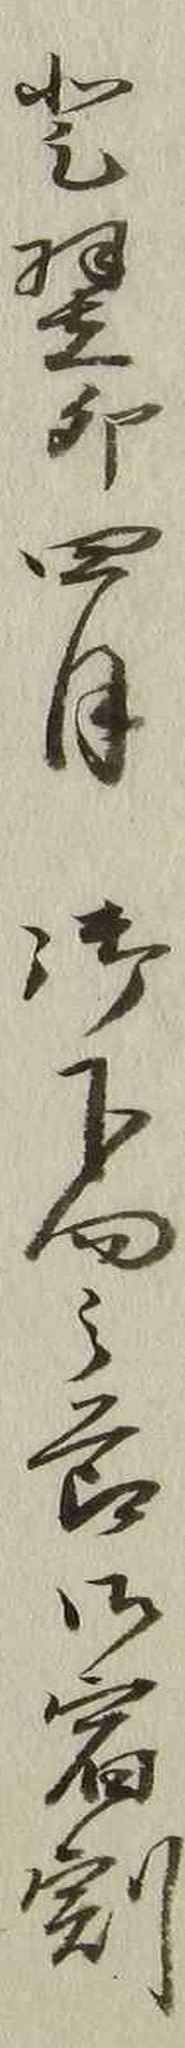登翌卯四月御下向之節御宿割
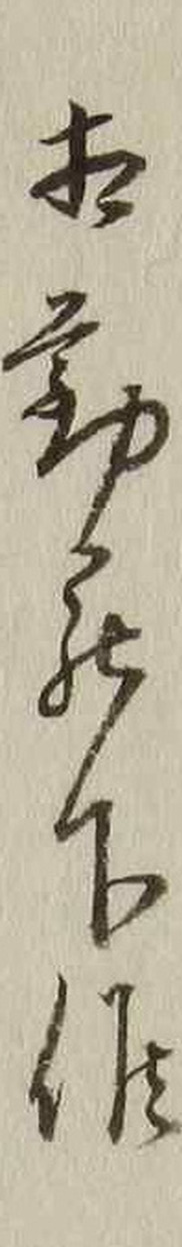相勤罷下候
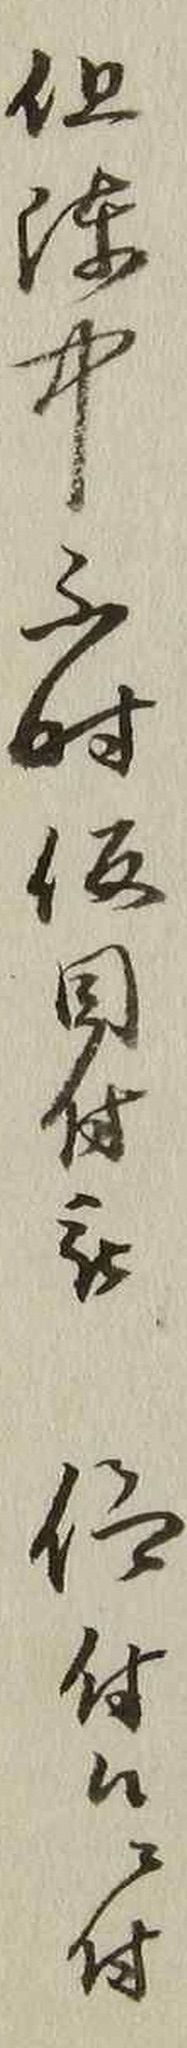但陣中不時仮目付被仰付候ニ付
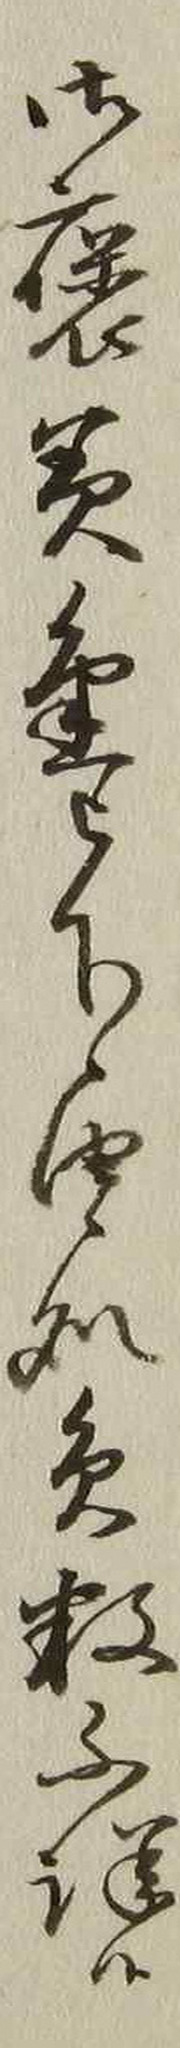御褒美金被下候由候処員数不詳候
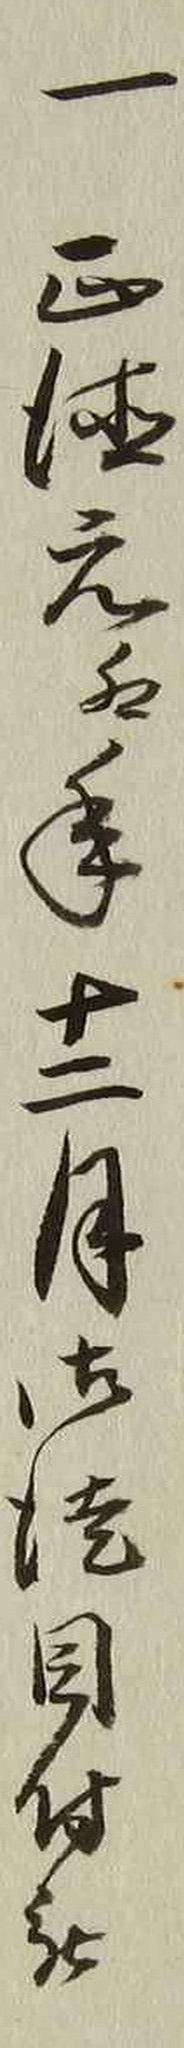一正徳元卯年十二月御徒目付被
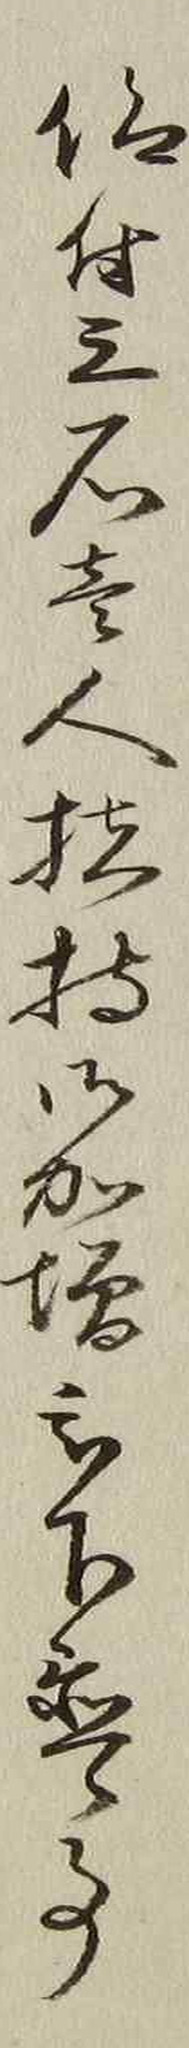仰付三石壱人扶持御加増被下置候事
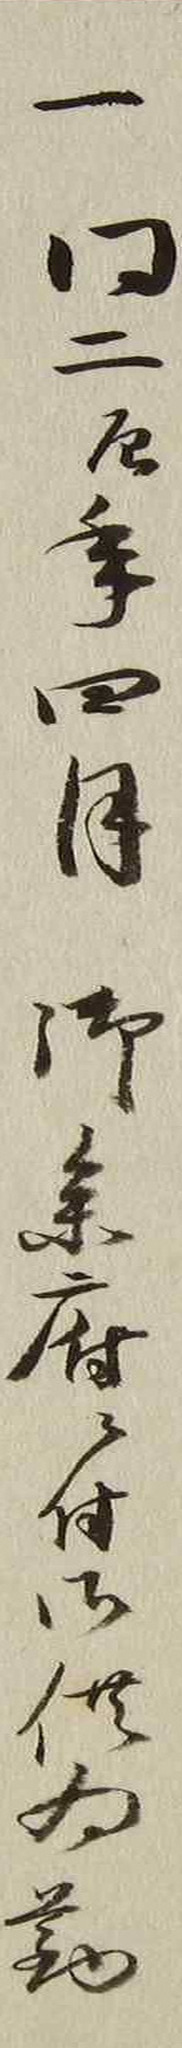一同二辰年四月御参府ニ付御供為勤
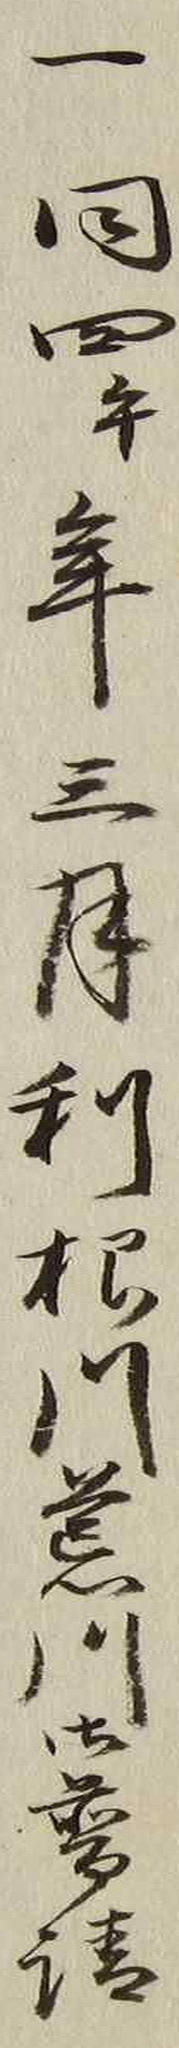一同四午年三月利根川荒川御普請
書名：諸士系譜　巻之102　か之部10
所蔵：会津若松市立会津図書館
